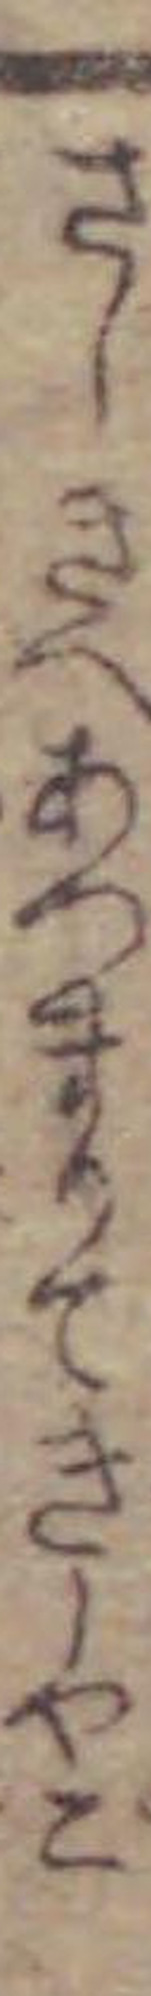ざしきへあつまりてきしやご
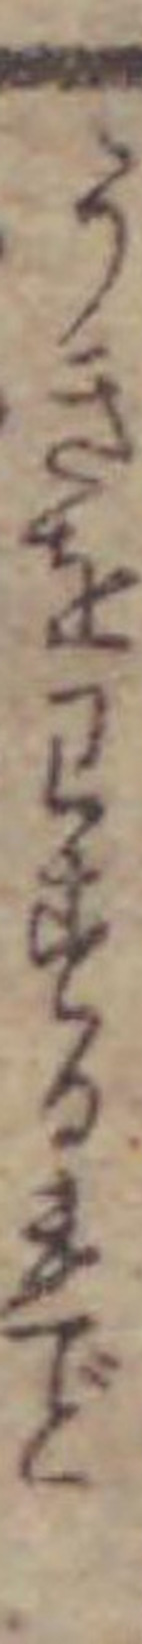うきをわするれど
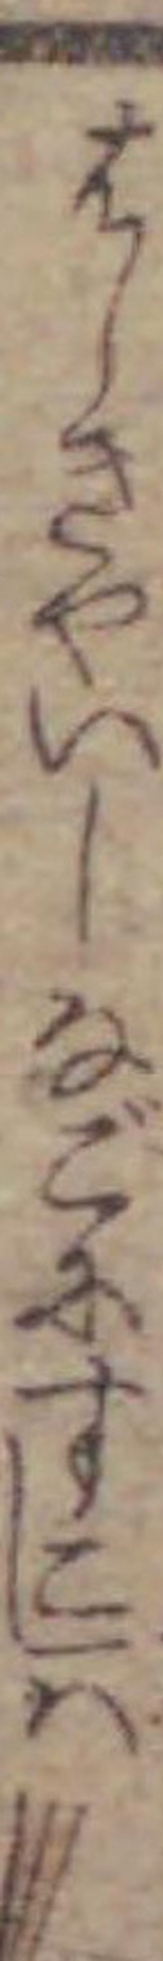はしきやいしなごにすこしは
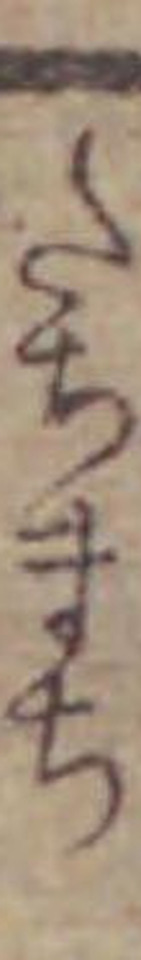たちまち
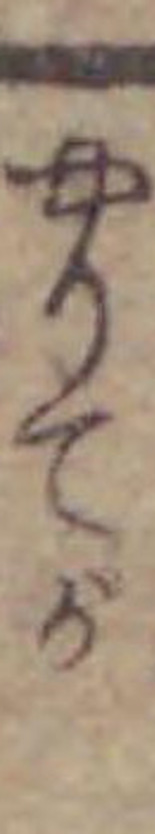やりてが
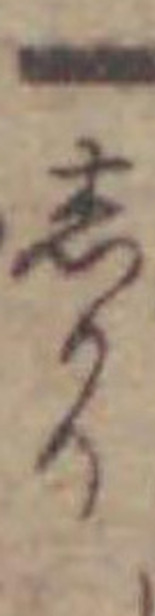しかり
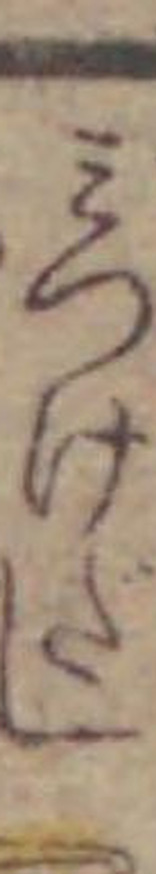みつけだし
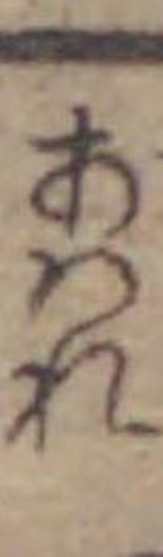あはれ
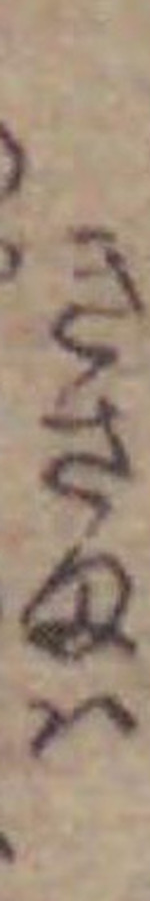きさまは
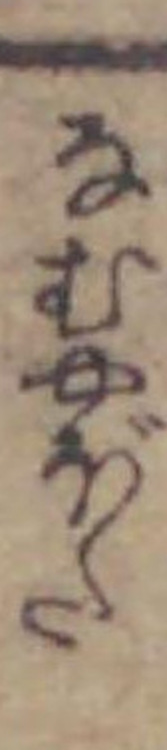なむやぼた
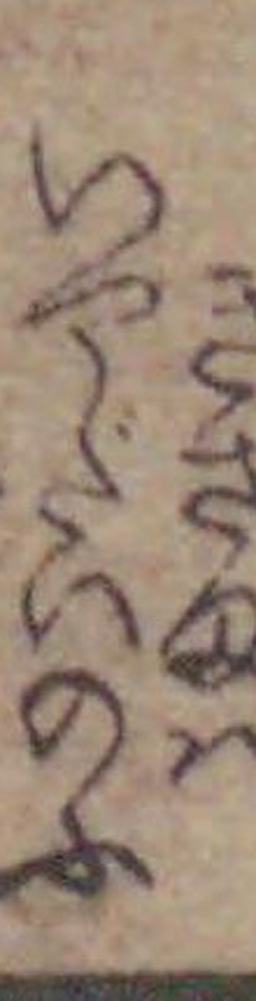いやだいのふ
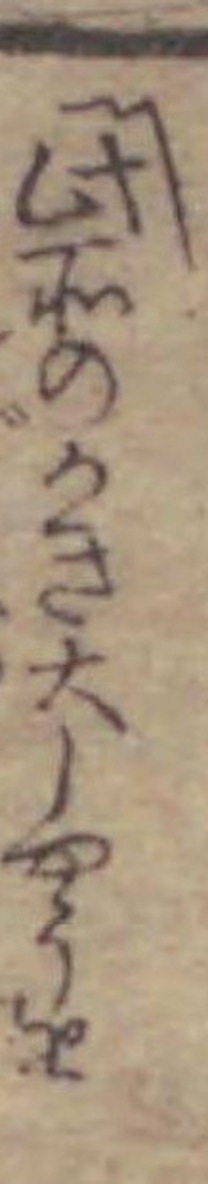「此所のかき大しやうを
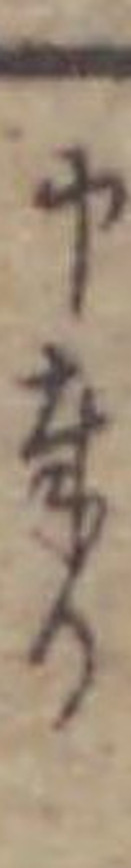申奉り
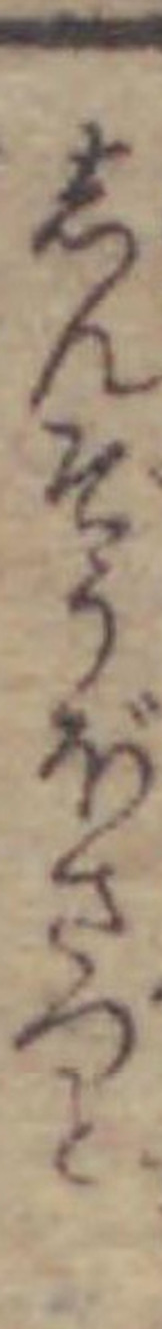しんぞうぼさつと
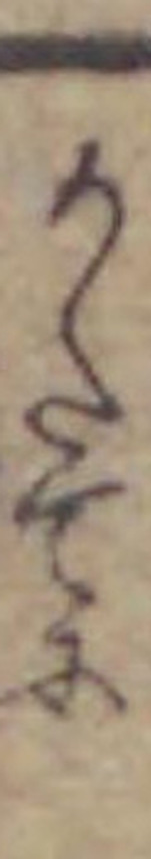かたてに
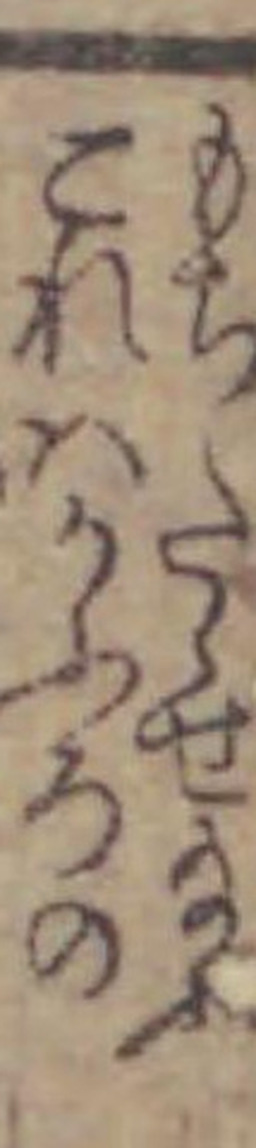これはかふろの
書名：九替十年色地獄 : 3巻
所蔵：国立国会図書館 National Diet Library, JAPAN
